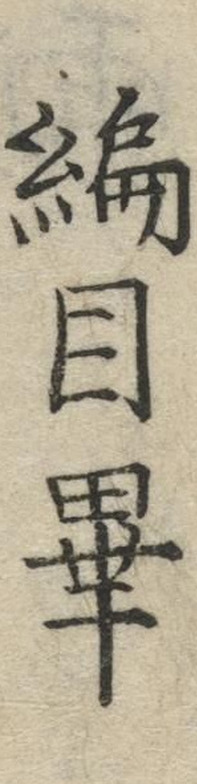編目畢
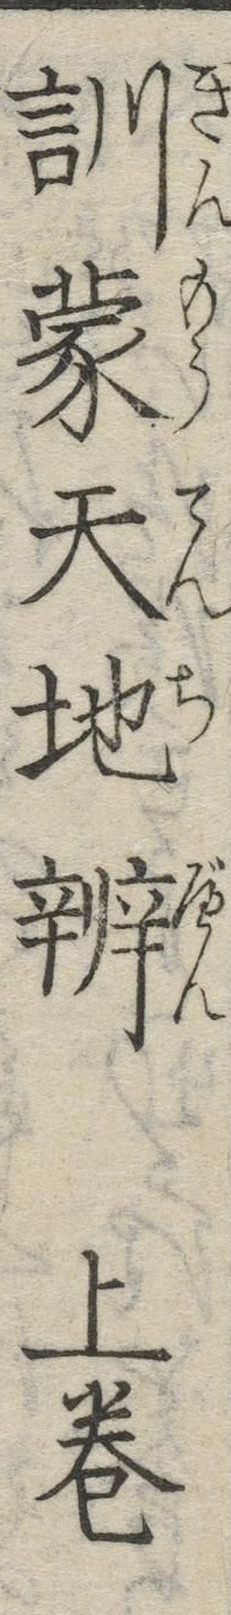訓蒙天地弁上巻
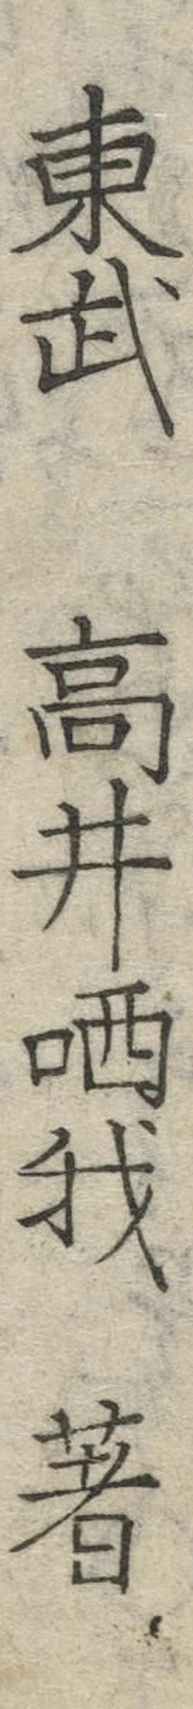東武高井哂我著
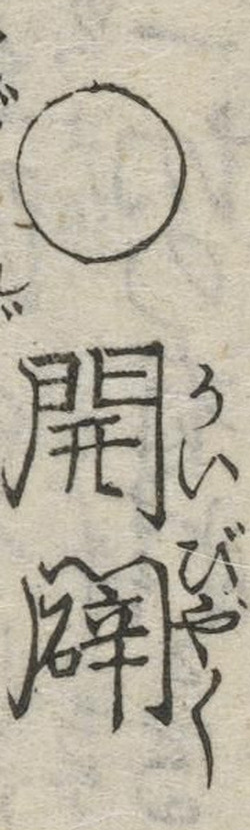○開闢
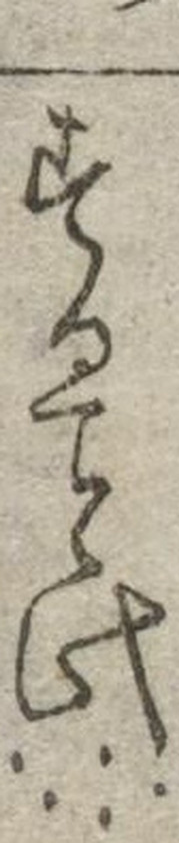するは此
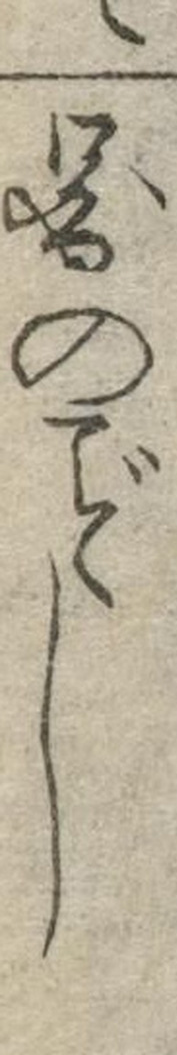図のごとし
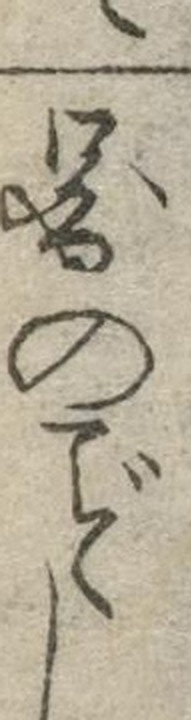図のごとし

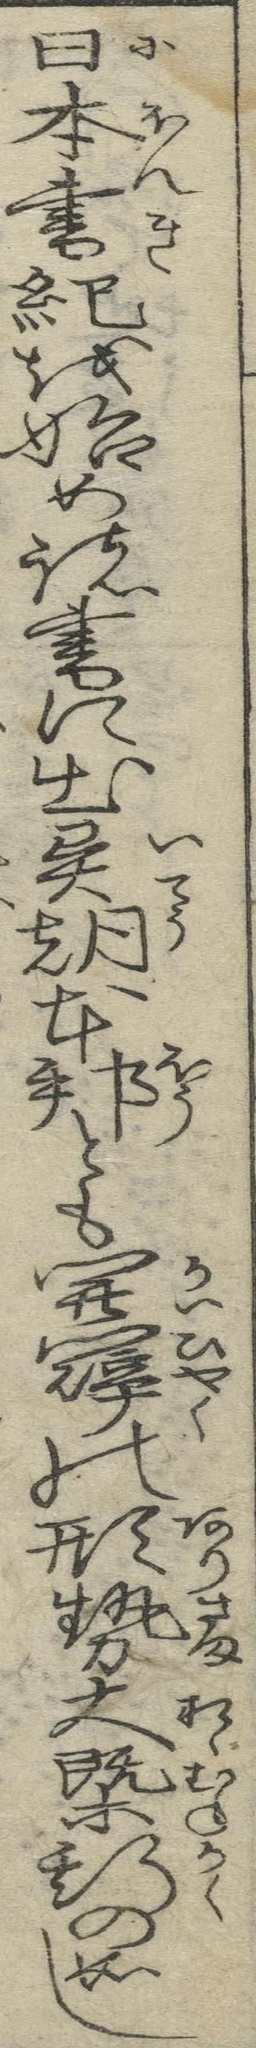日本書紀を始め諸書に出異朝本邦とも開闢の形勢大槩斯の如し
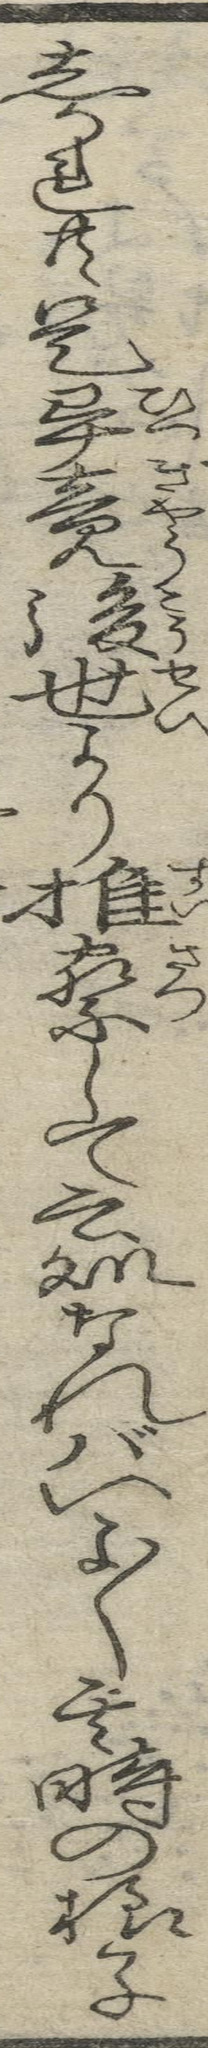しかれば是畢竟後世より推察して云処なればいよ〳〵其時の様子
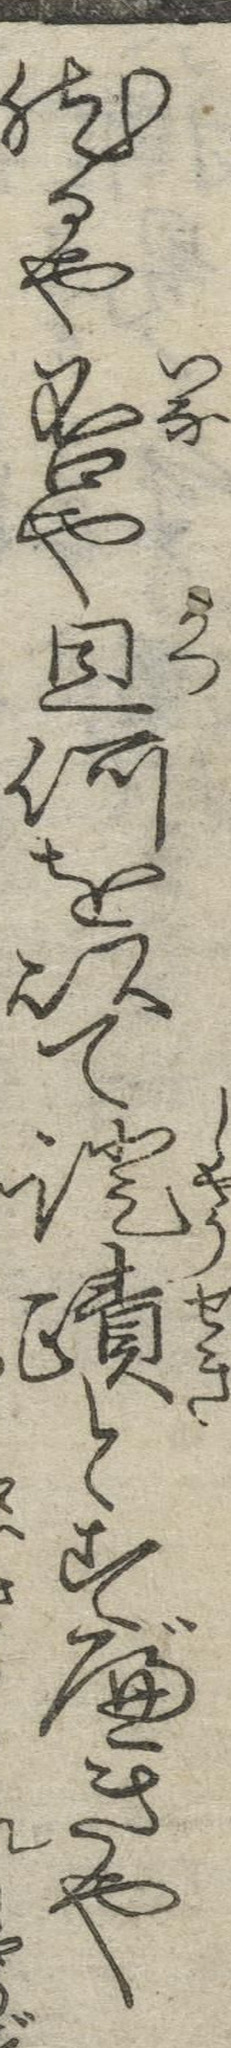然るや否や且何を以て証跡とすべきや
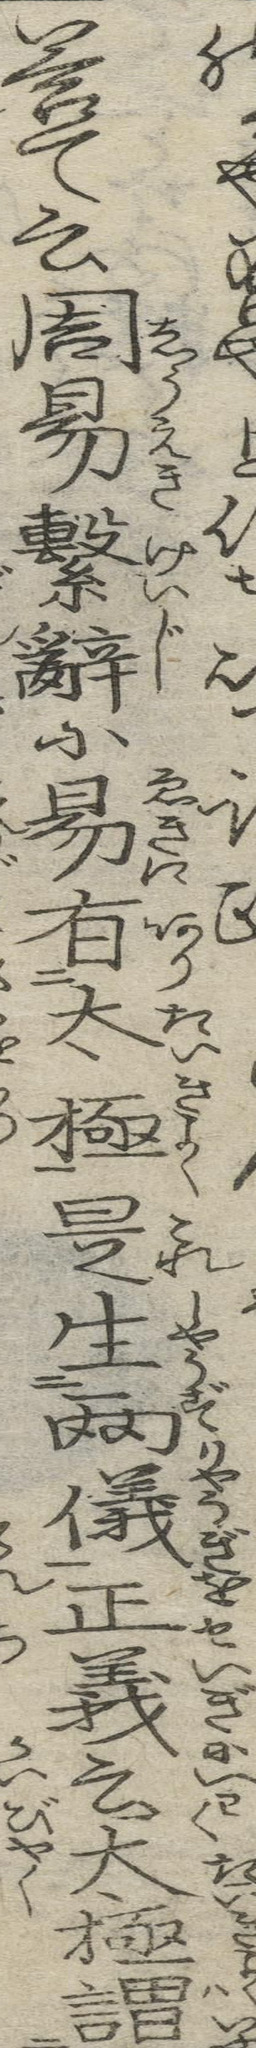答て云周易繋辞に易有太極是生両儀正義云太極謂
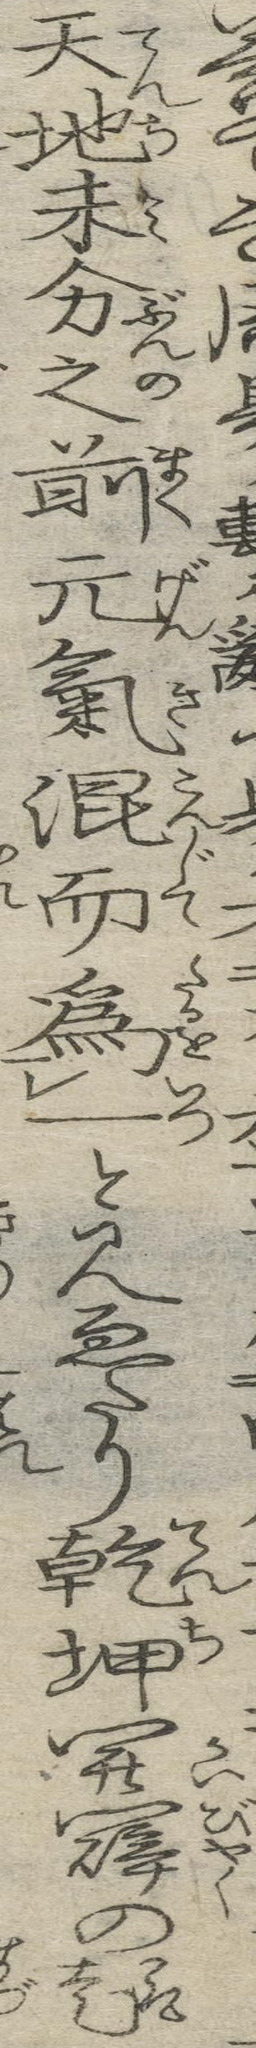天地未分之前元気混而為一と見ゑたり乾坤開闢の趣
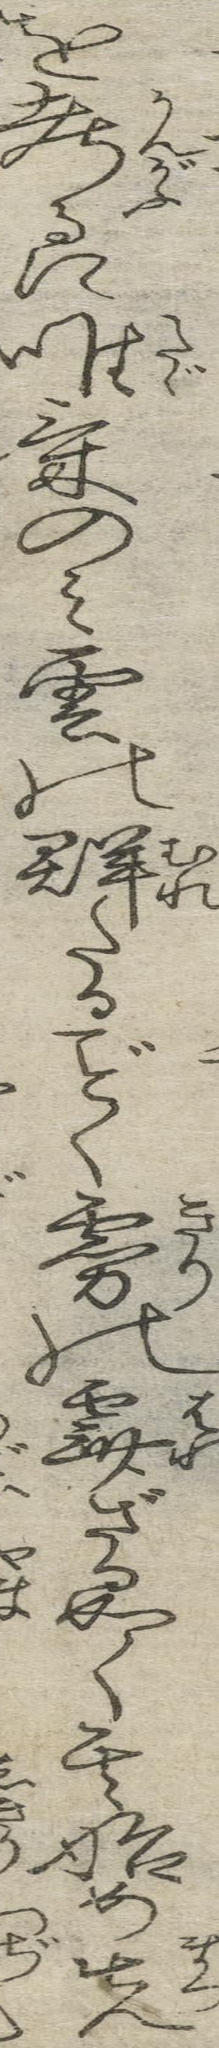を考るに唯氣のみ雲の群たるごとく霧の霽ざる如く其始め先
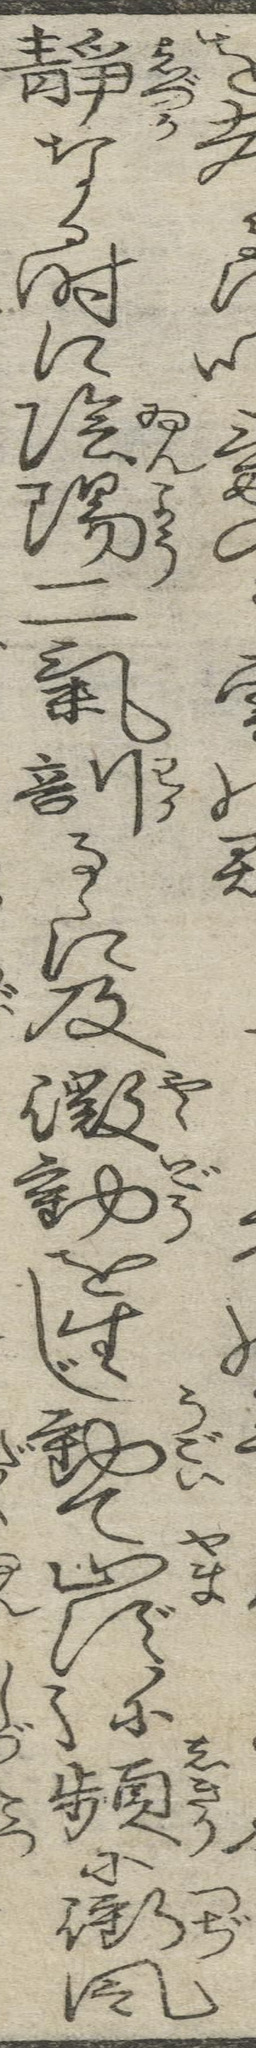静なる時に陰陽二氣剖るゝに及微動を生じ動いて止ずに頻に衢風
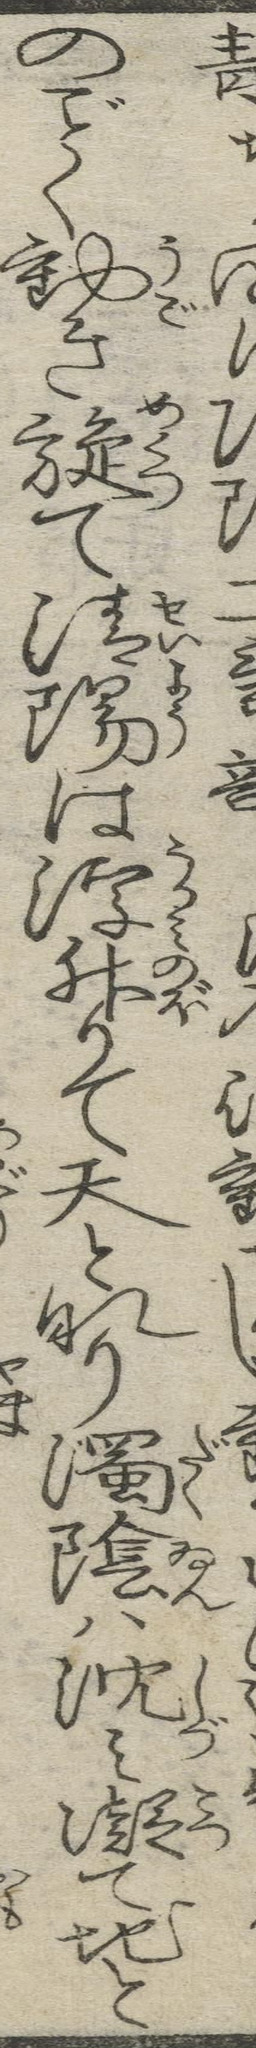のごとく動き旋て清陽は浮升りて天となり濁陰は沈み凝て地と
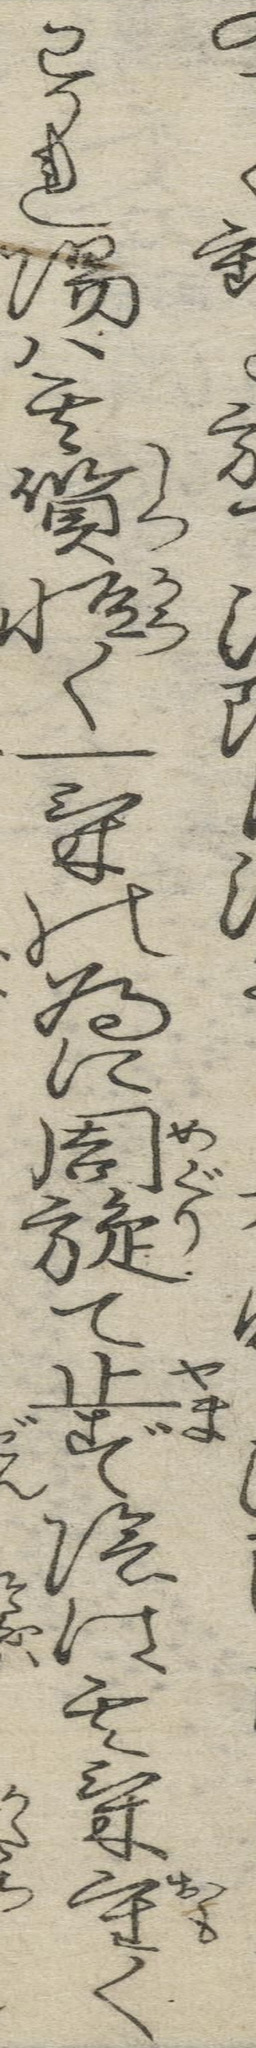わかれ陽は其質軽く一氣の為に周旋て止ず陰は其氣重く
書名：訓蒙天地辨　天
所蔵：東京大学地震研究所図書室 Earthquake Research Institute Library, The University of Tokyo, JAPAN
